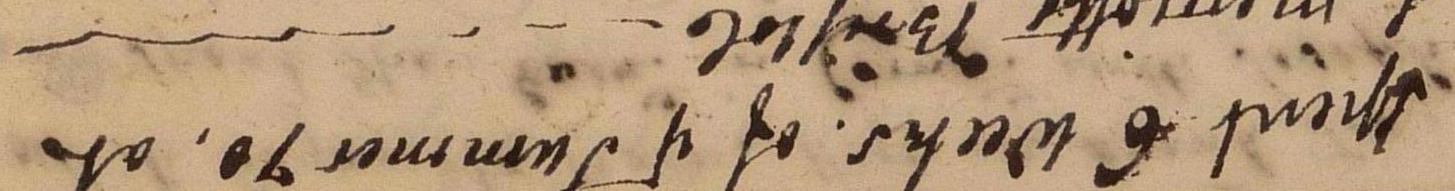Spent 6 weeks of y^e Summer 70. at
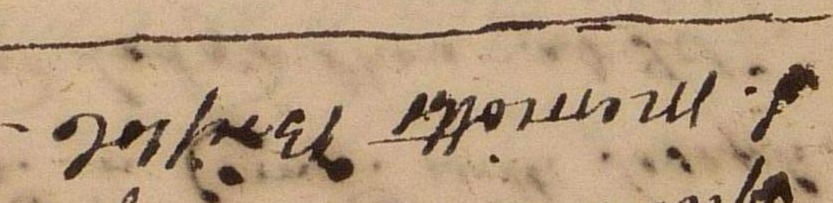S. Merriotts Bristol-
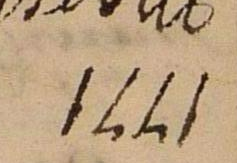1771
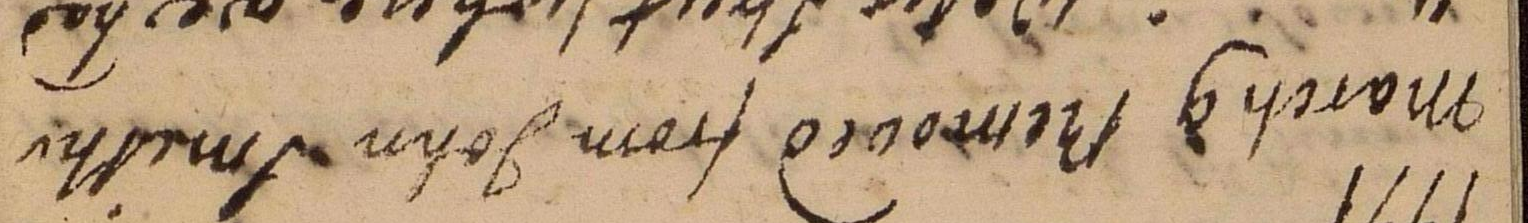March 9 Removed from John Smiths
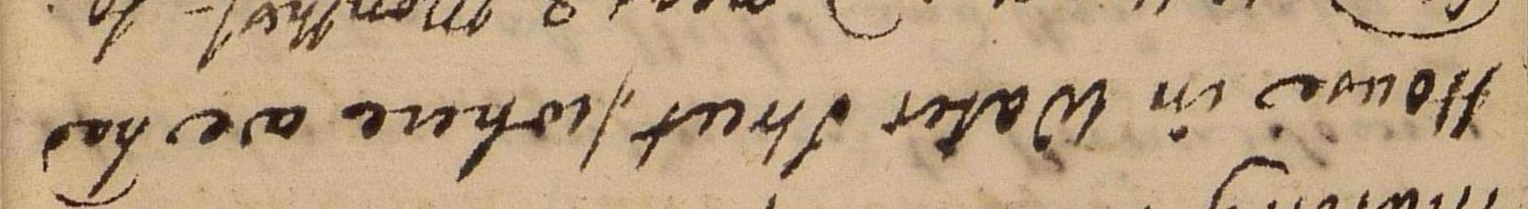House in Water Street / where we had
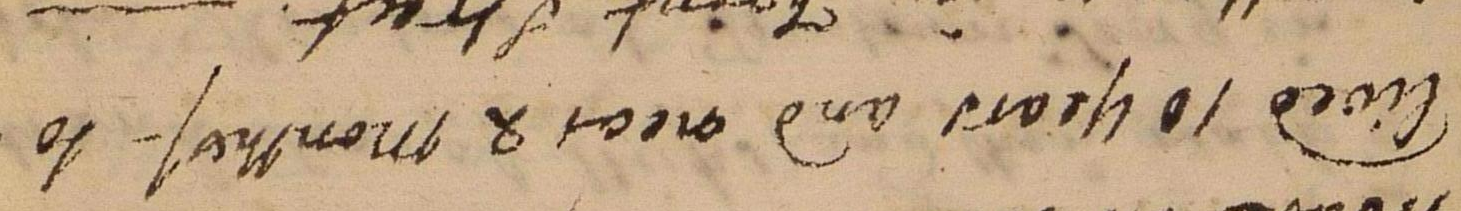lived 10 years and near 2 months / - to
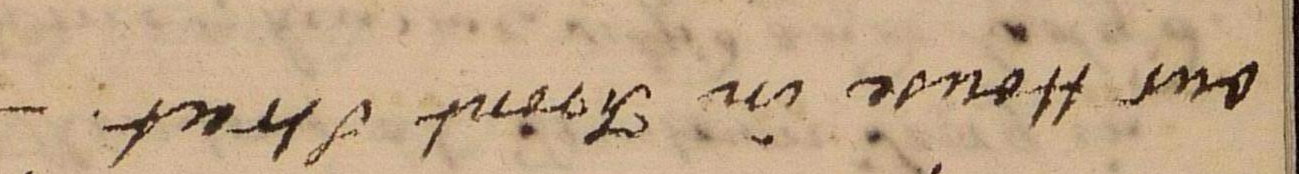our House in Front Street-
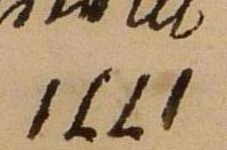1771
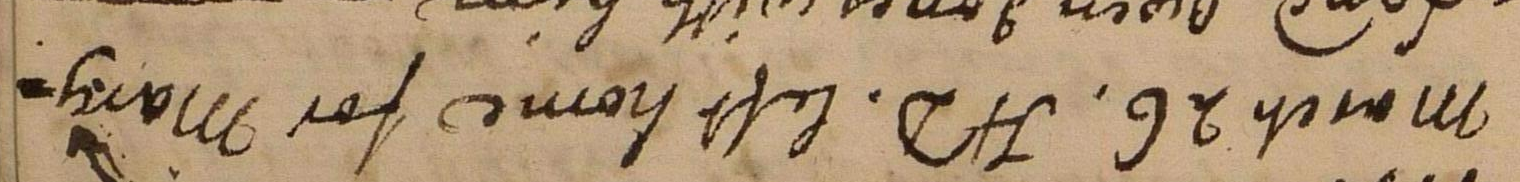March 26. HD. left home for Mary-
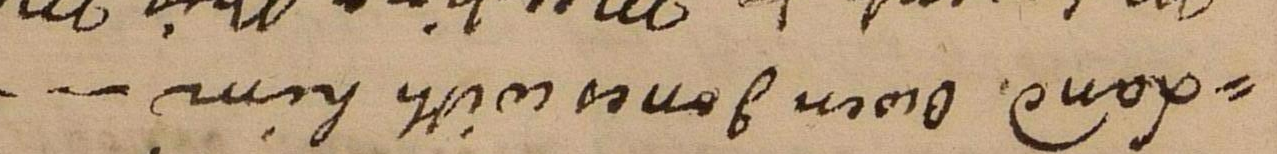-Land. Owen Jones with him-
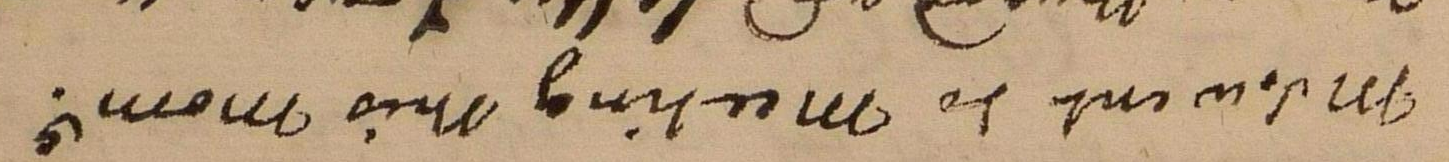MS. went to Meeting this Morn^g.
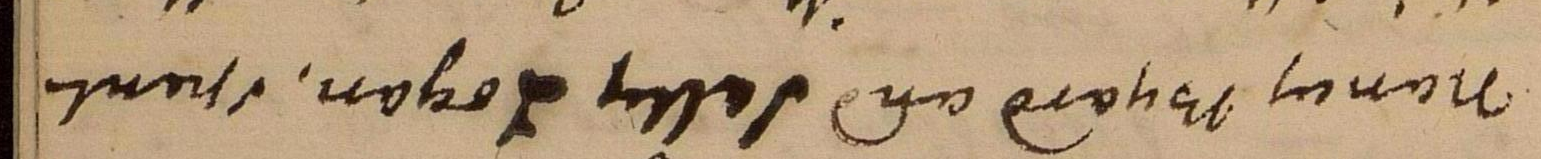Nancy Byard and Sally Logan, spent
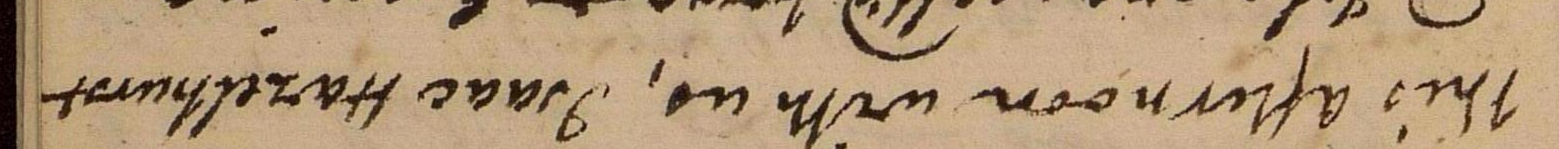this Afternoon with us, Isaac Hazelhurst
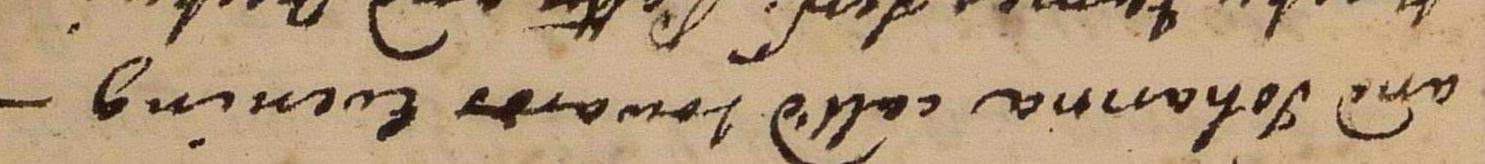and Johanna call'd towards Evening-
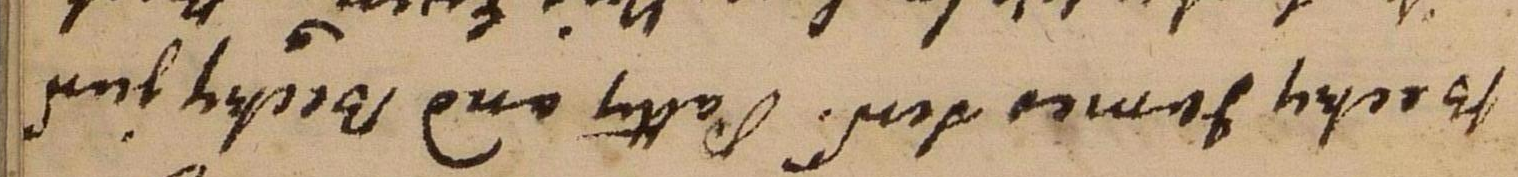Becky James Sen^r. Patty and Becky jun^r
